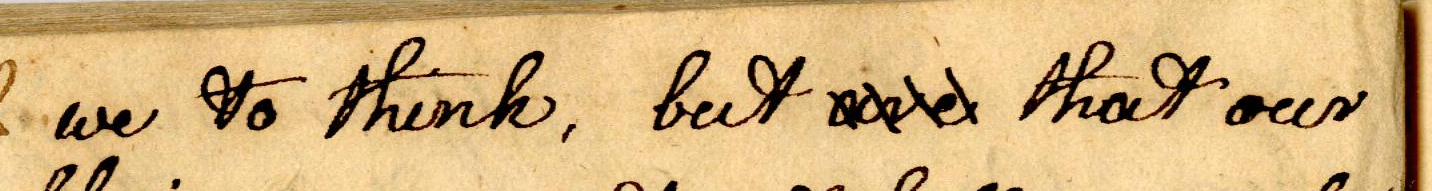we to think, but [are] that our
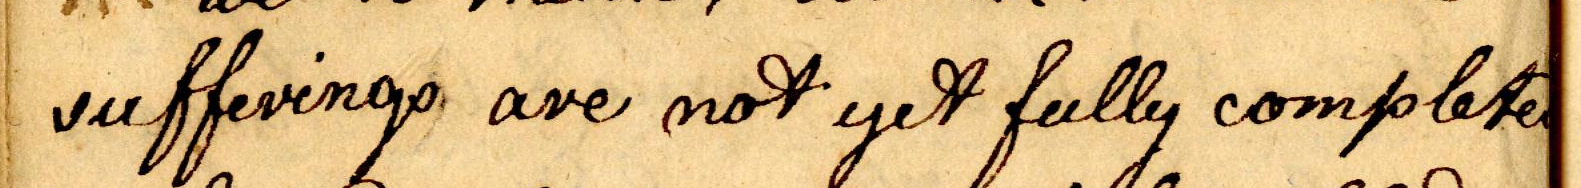sufferings are not yet fully complete
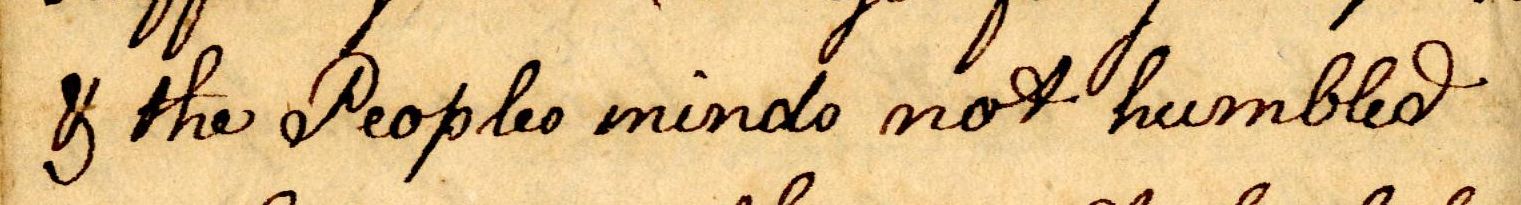& the Peoples minds not humbled
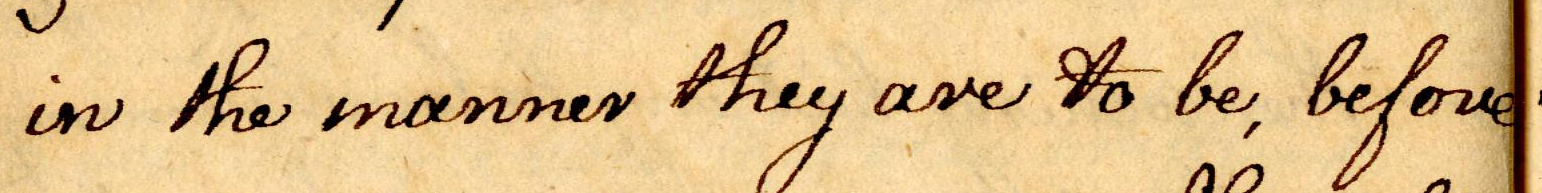in the manner they are to be, before
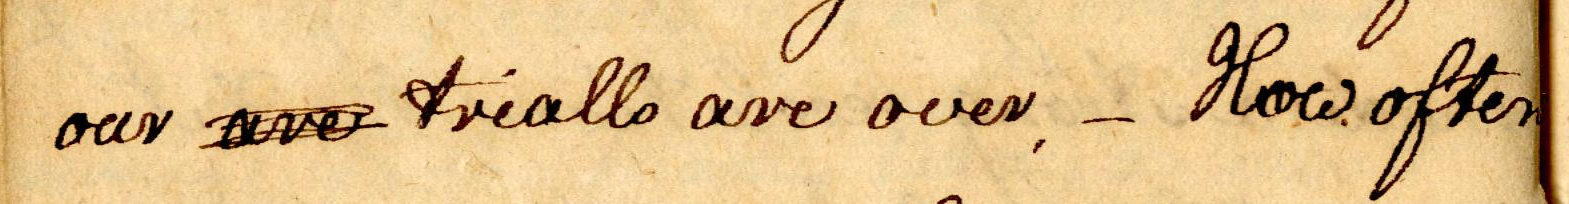our [___] trialls are over,- How often
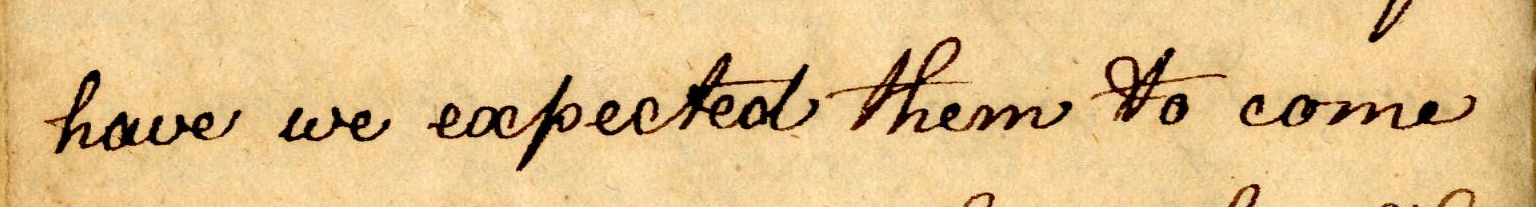have we expected them to come
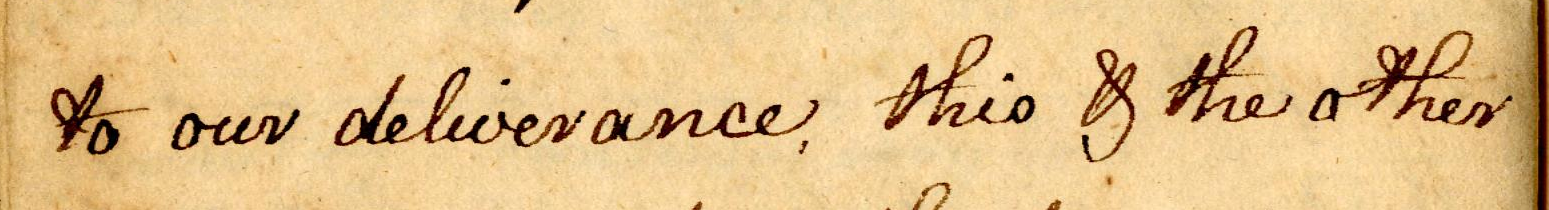to our deliverance, this & the other
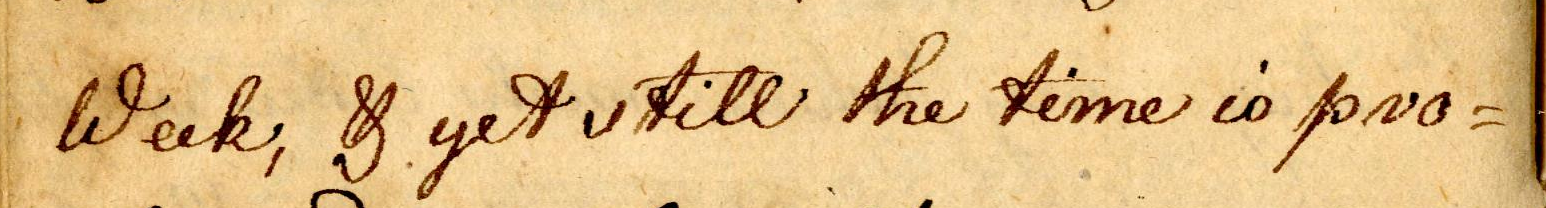Week, & yet still the time is pro-
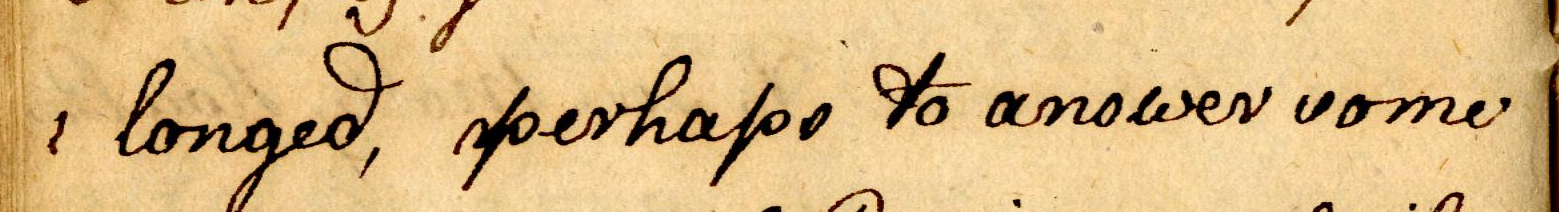-longed, perhaps to answer some
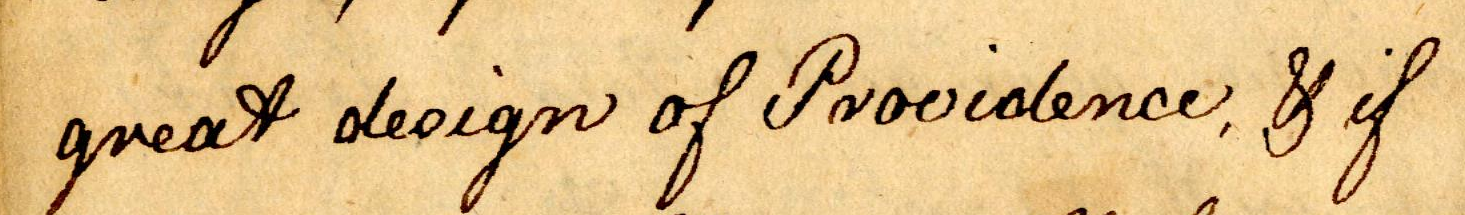great design of Providence, & if
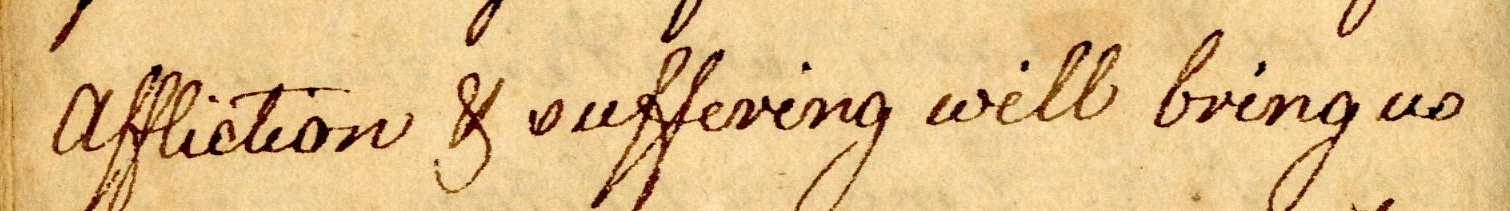Affliction & suffering will bring us
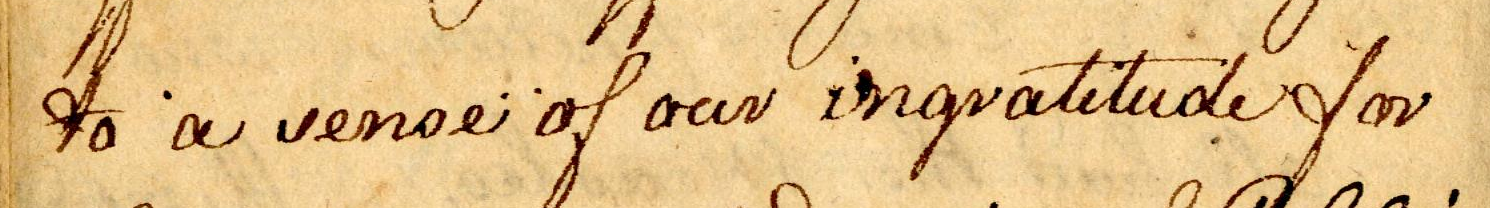to a sense of our ingratitude for
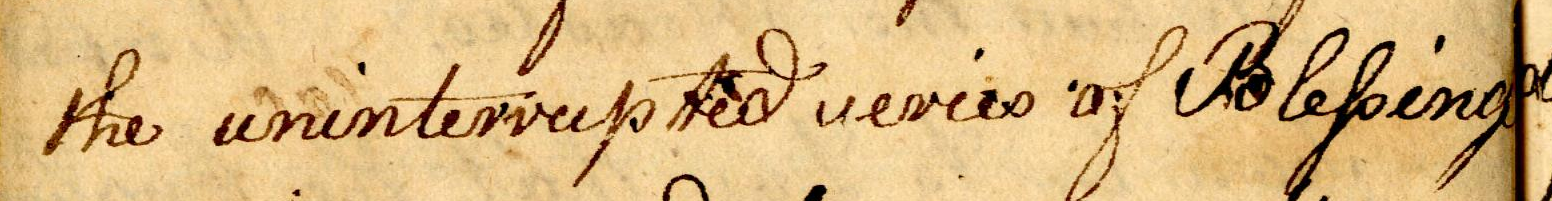the uninterrupted series of Blessing
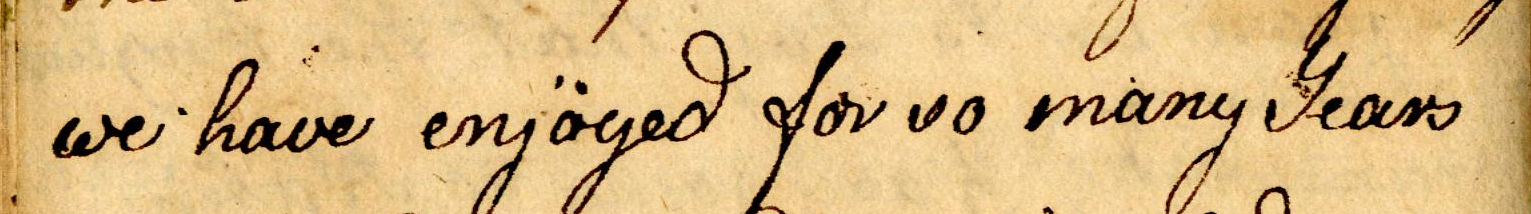we have enjoyed for so many Years
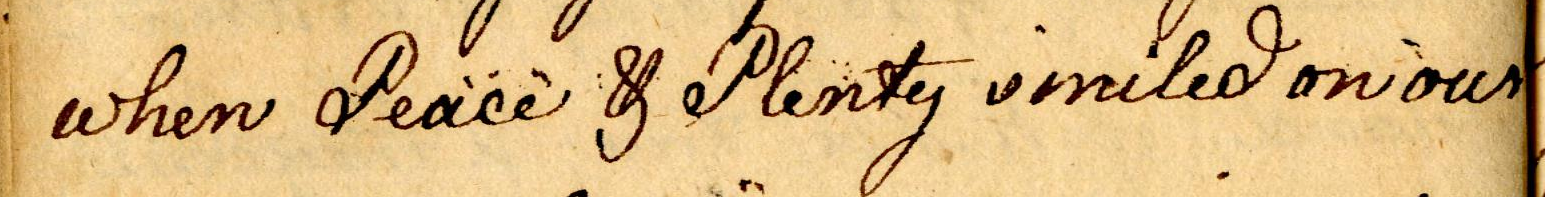when Peace & Plenty smiled on our
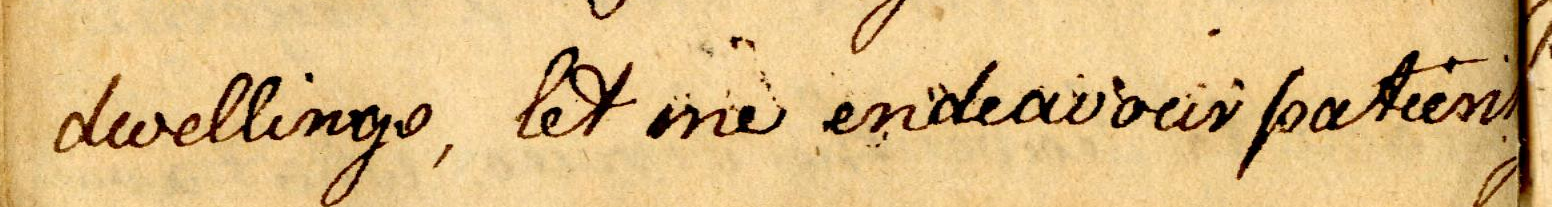dwellings, let me endeavour patien
